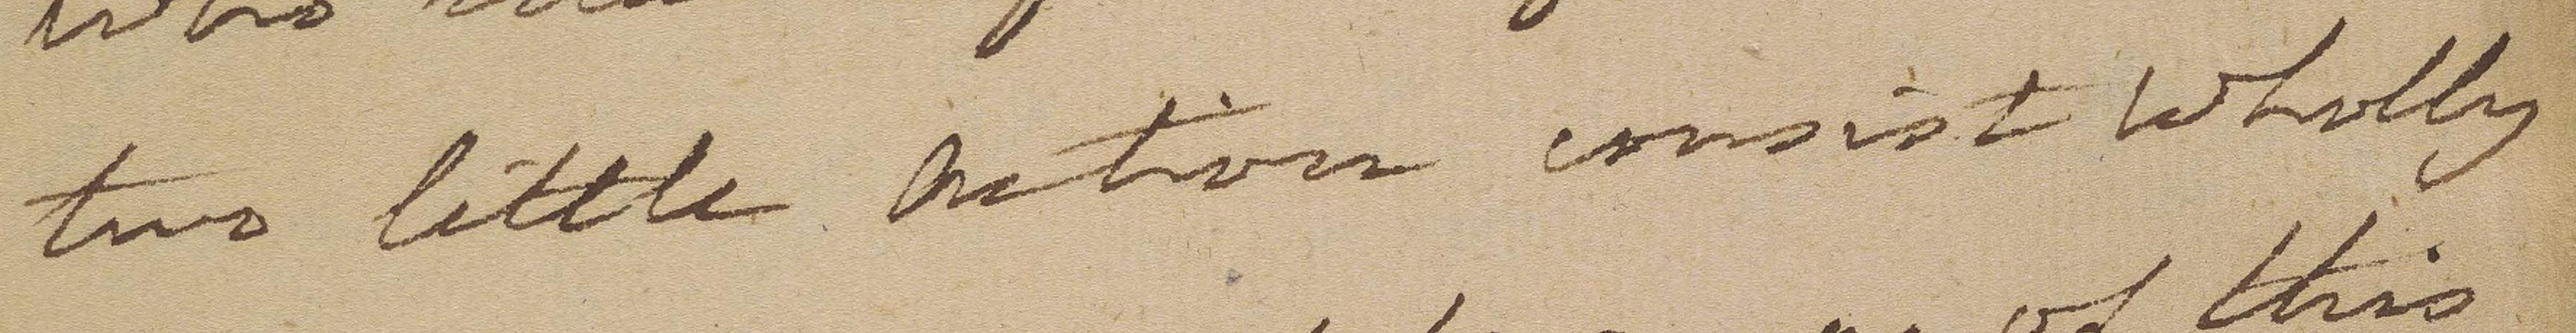too little action consist wholly
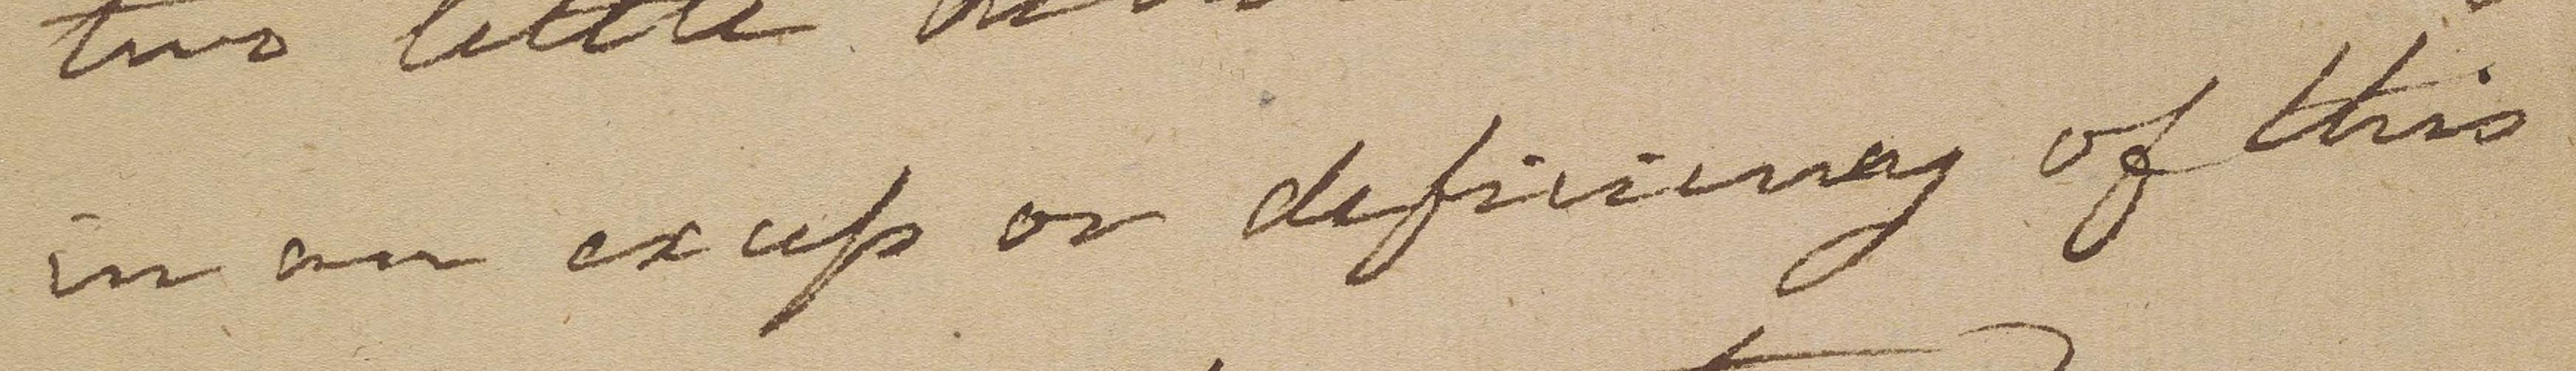in an excess or deficiency of this
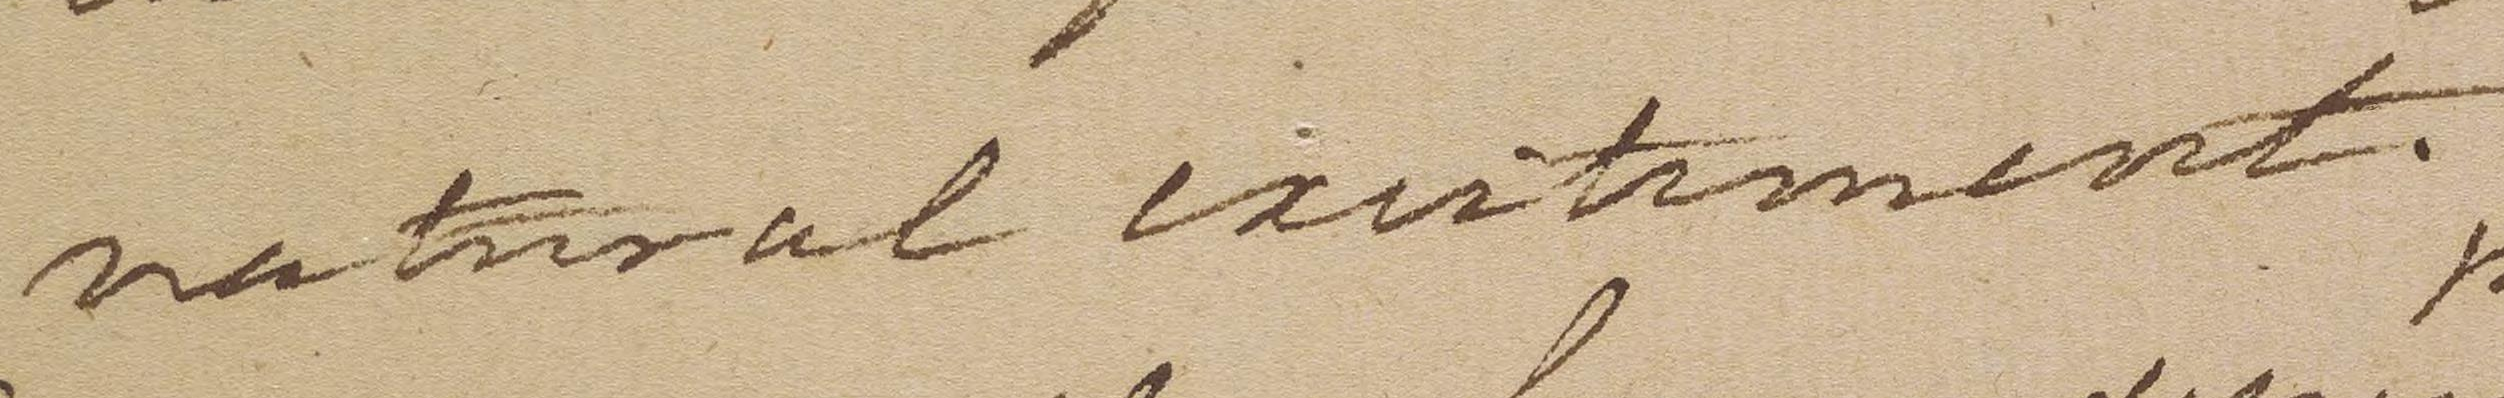natural excitement.
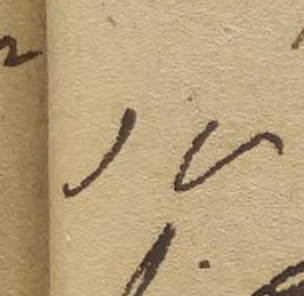IV
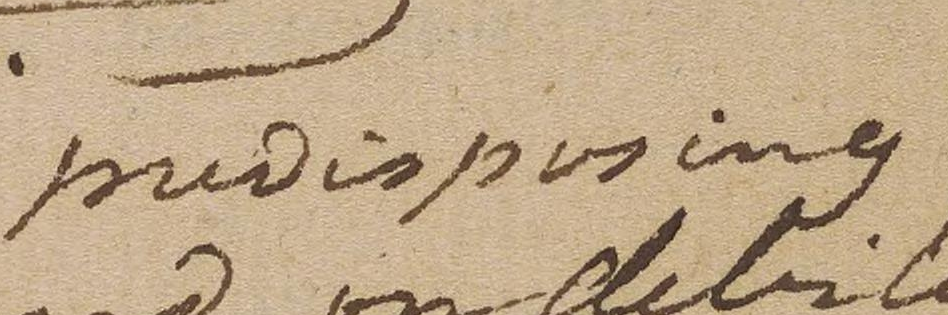predisposing
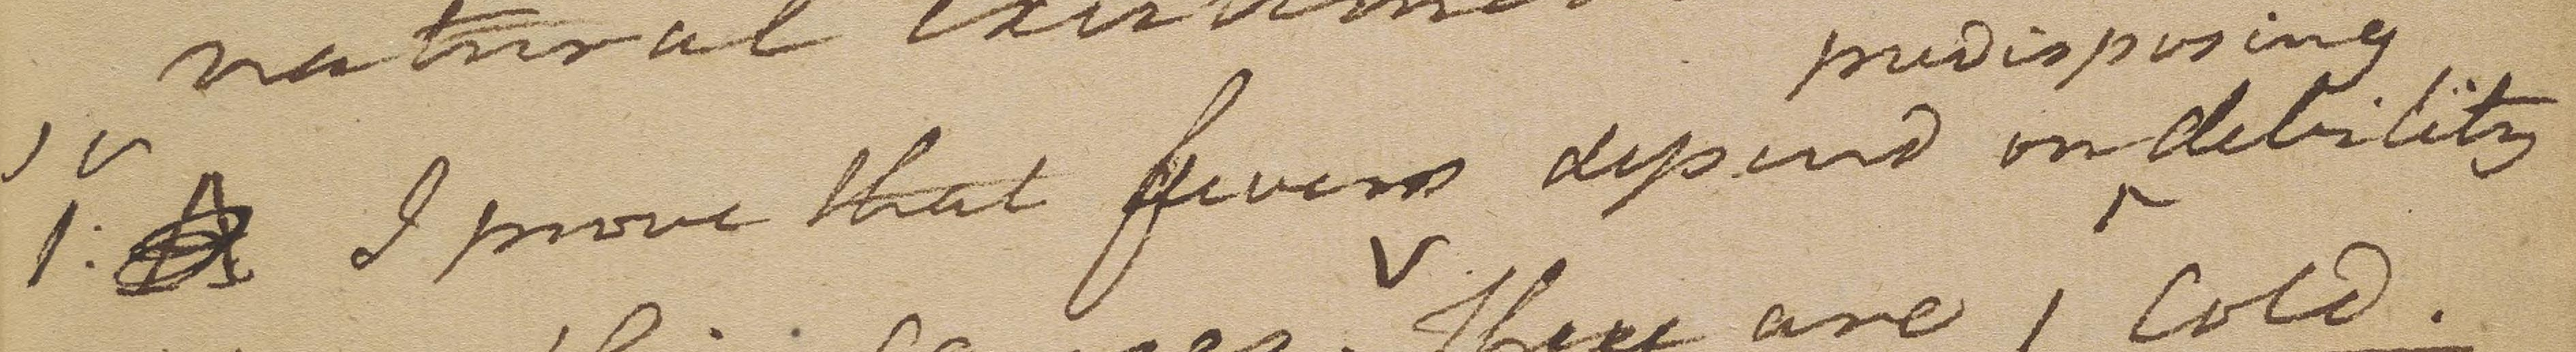IV I prove that fevers depend on ^ debility
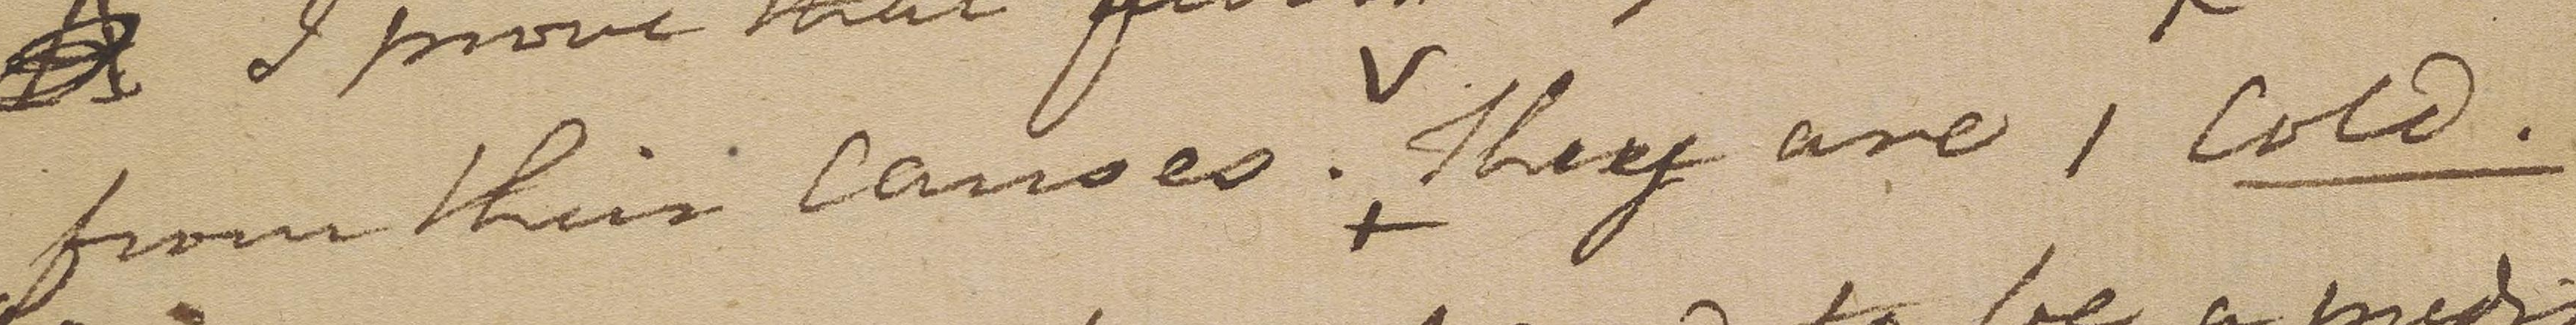from their causes. ^Vt They are, cold.
